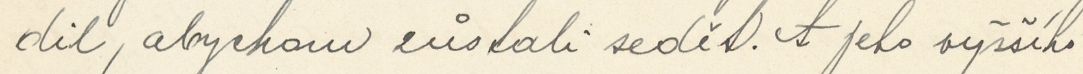dil, abychom zůstali sedět. A jeho vyššího
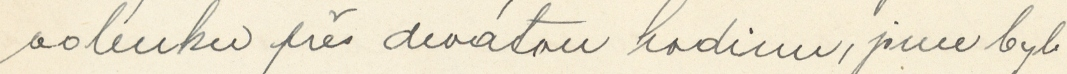volenku přes devátou hodinu, jsme byli
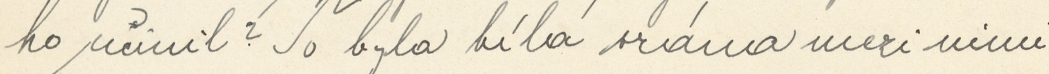ho učinil? To byla bílá vrána mezi nimi.
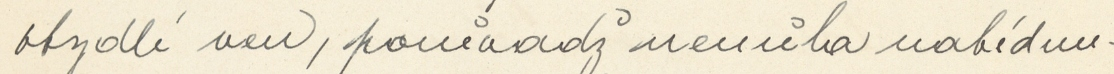obydlí ven, poněvadž neměla nabídnu-
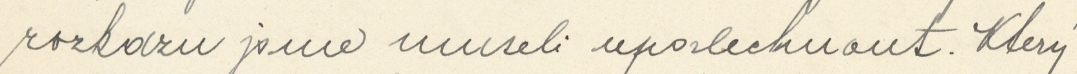rozkazu jsme museli uposlechnout. Který
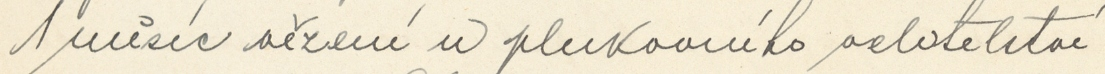1 měsíc vězení u plukovního velitelství.
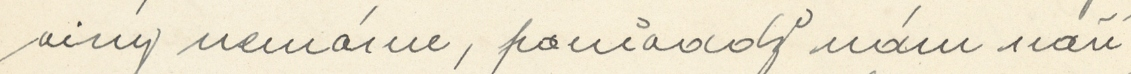viny nemáme, poněvadž nám naří-
